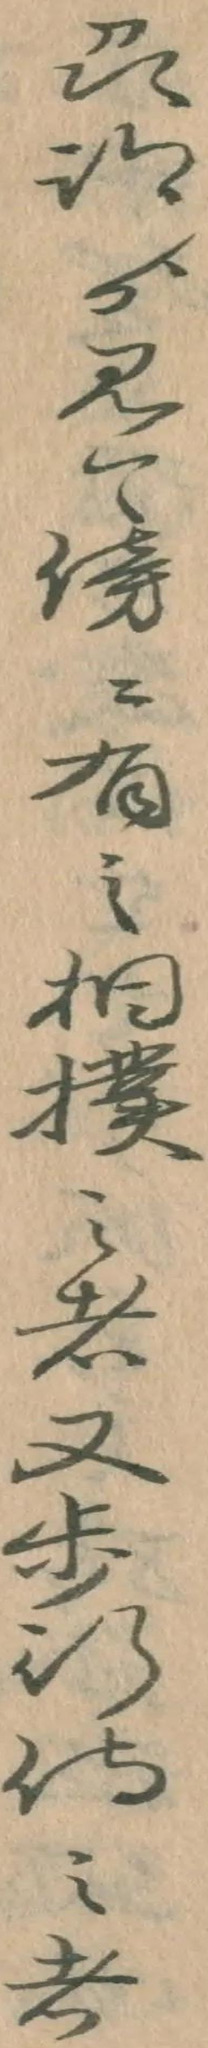州跡ゟ見て傍に有之相撲之者又歩行侍之者
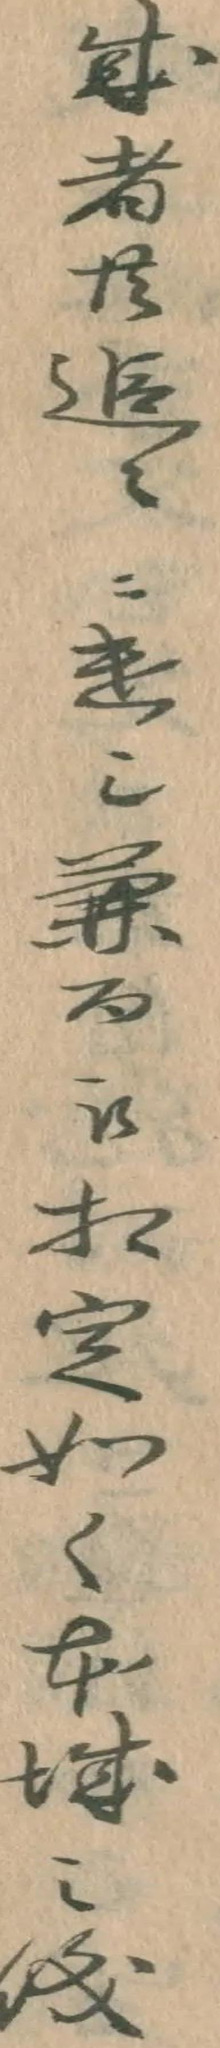成者共追々に遣し兼而被相定如く本城之儀
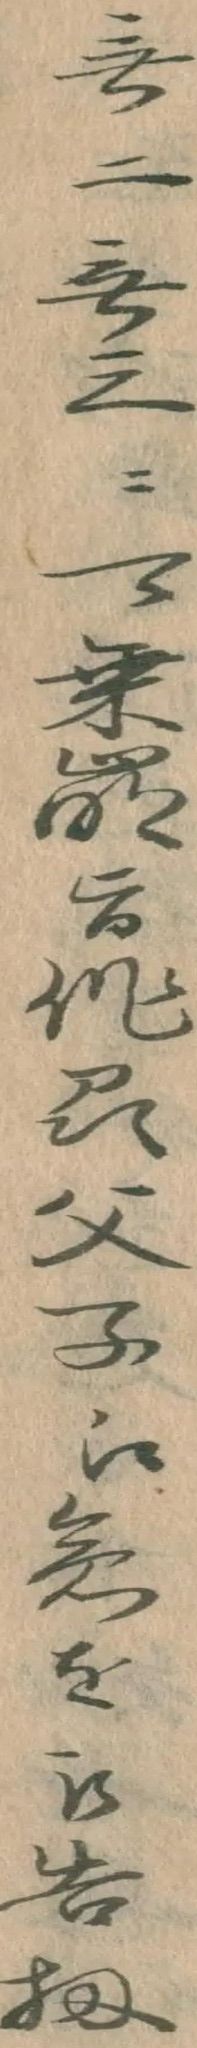無二無三に可乗崩旨作州父子江急を被告扨
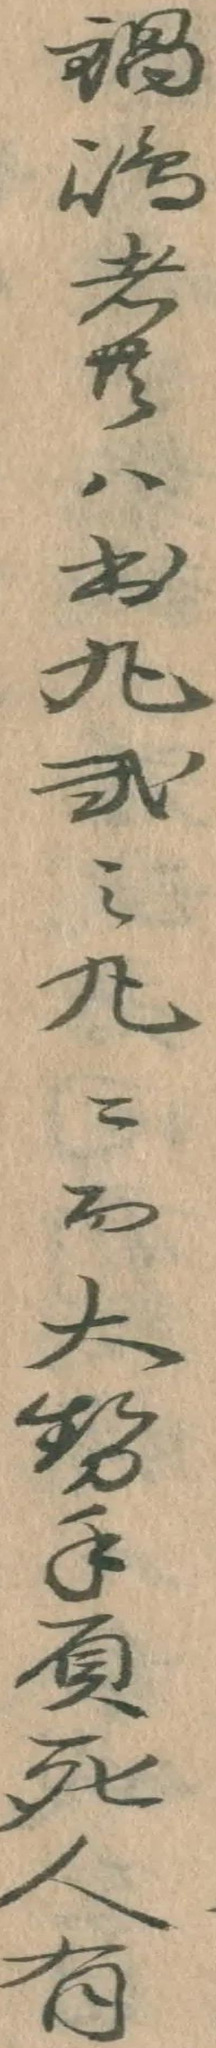鍋島者共は出丸弐之丸に而大勢手負死人有
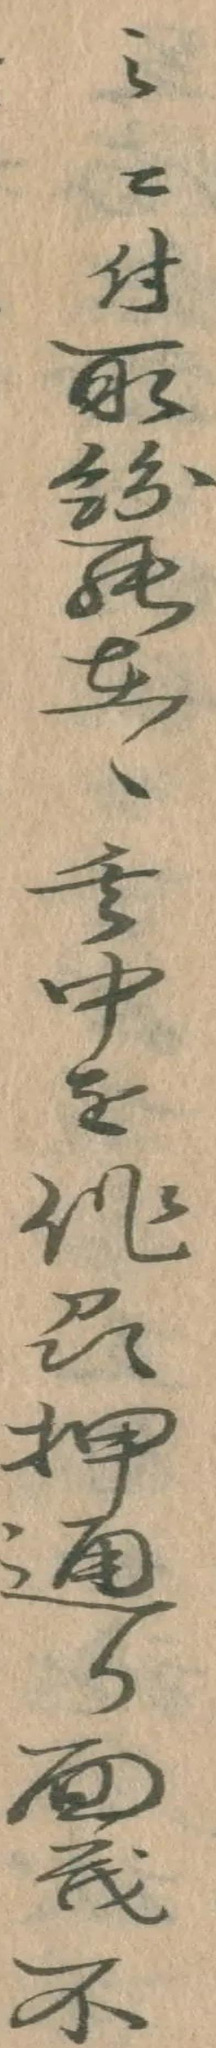之に付取紛罷在候其中を作州押通り面茂不
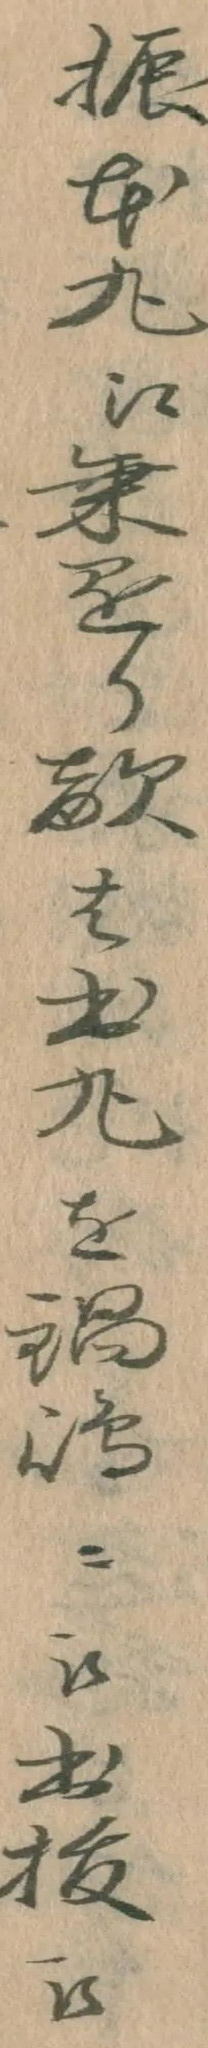振本丸江乗懸り敵者出丸を鍋島に被出抜被
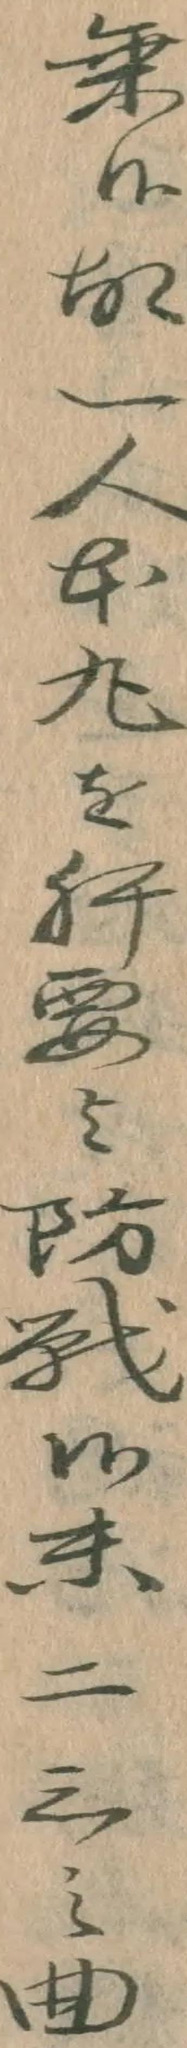乗候故一人本丸を肝要与防戦候未二三之曲
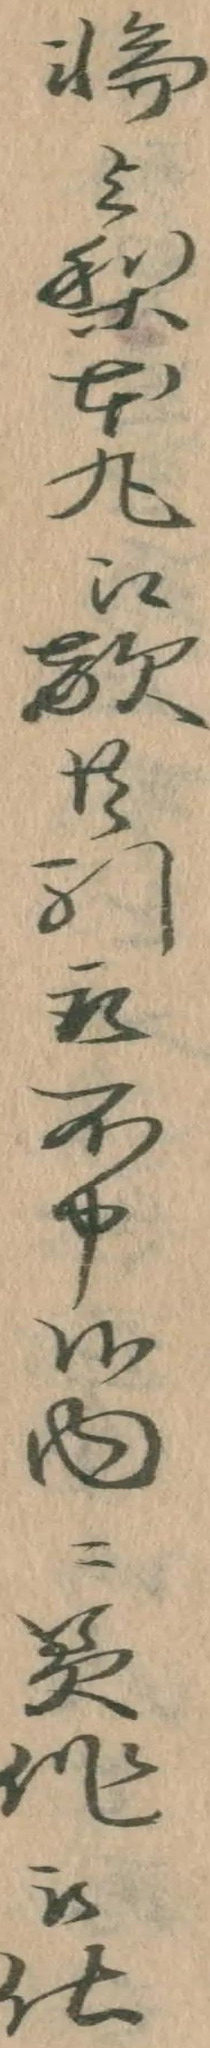輪与梨本丸江敵共引取不申候内に美作被仕
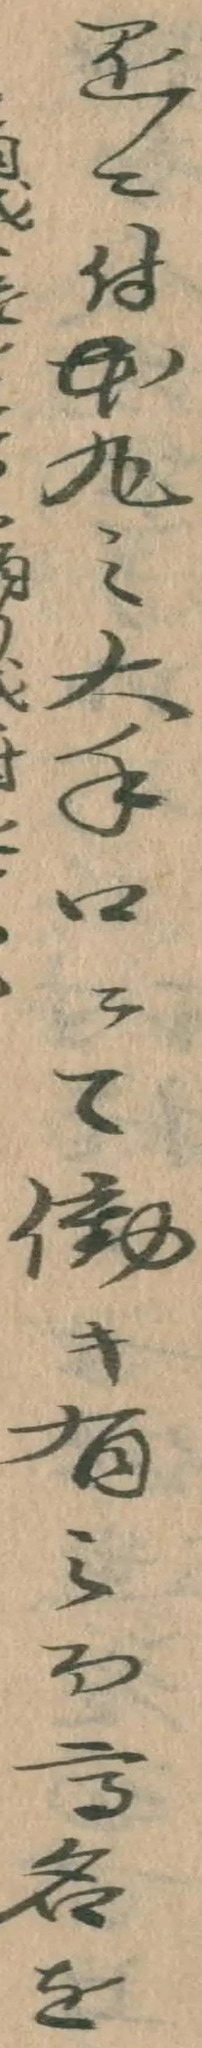懸に付本丸之大手口にて働き有之而高名を
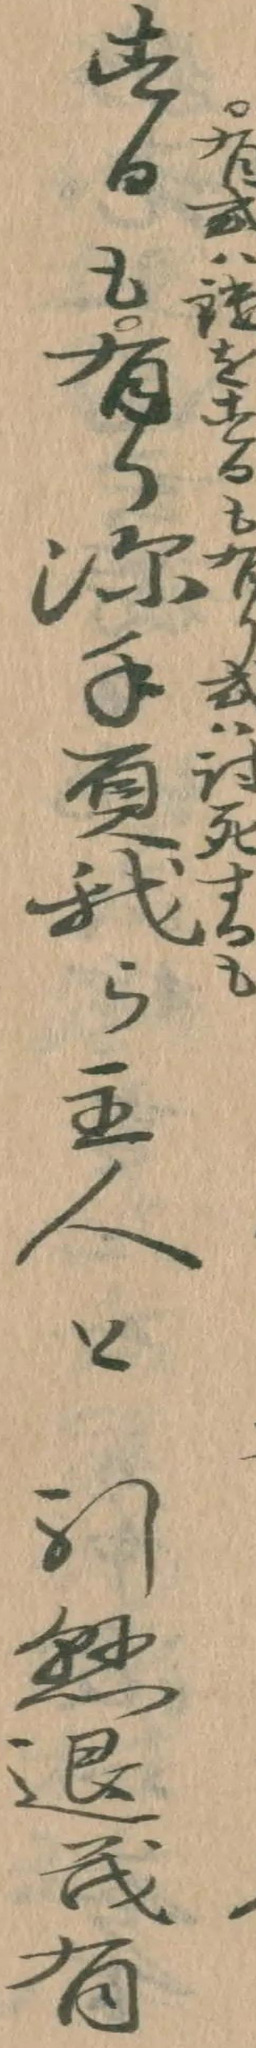春るも有り深手負我ら主人と引懸退茂有
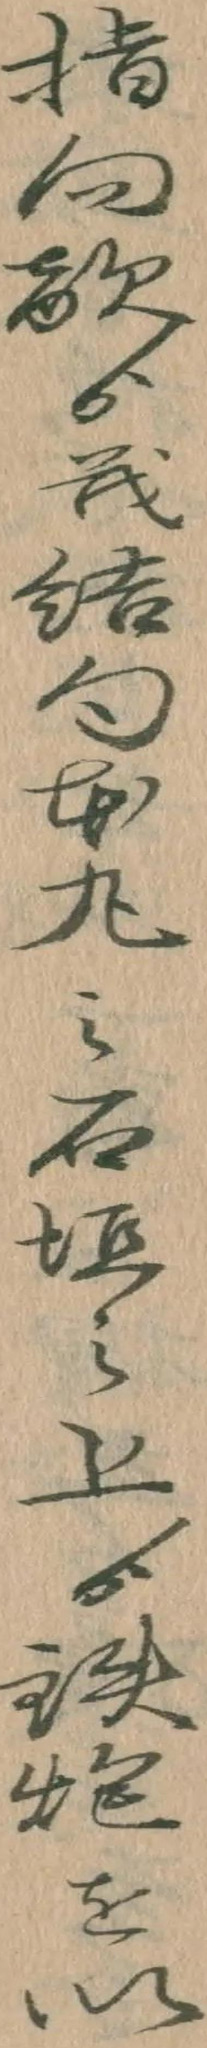指向敵ゟ茂結句本丸之石垣之上ゟ鉄砲を以
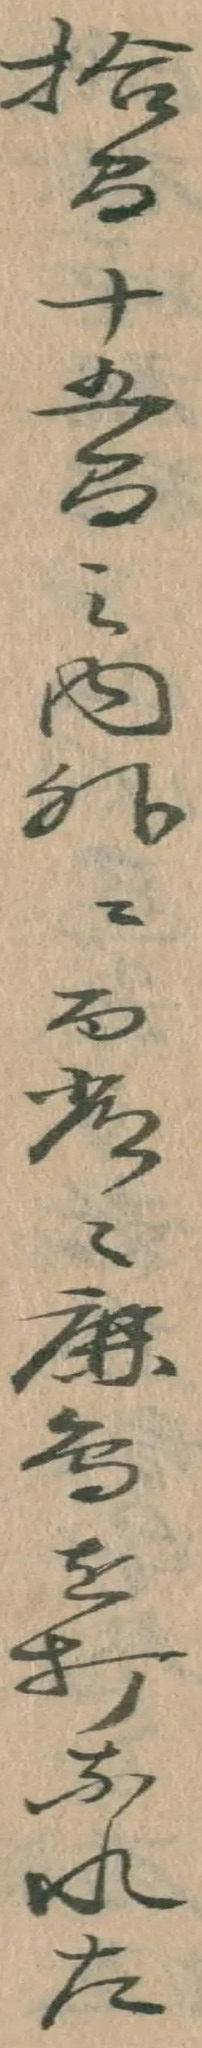拾間十五間之内外に而常々鹿鳥を打なれた
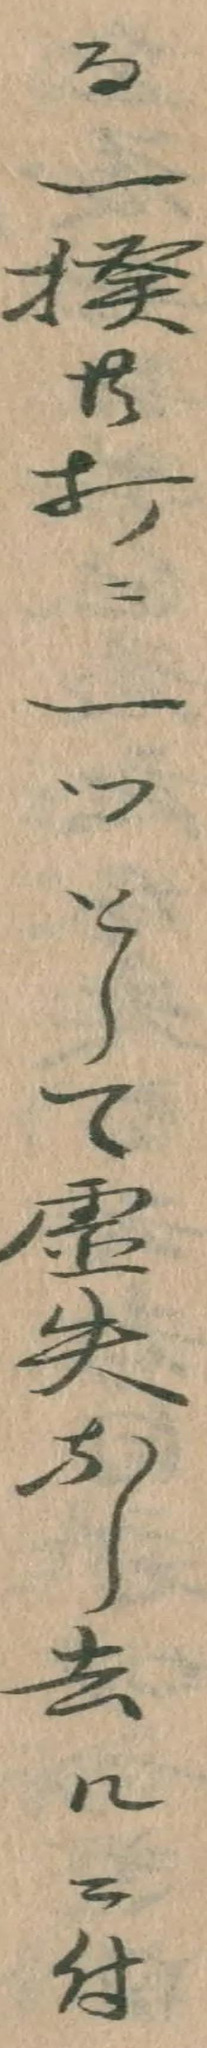る一揆共打に一つとして虚失なし去るに付
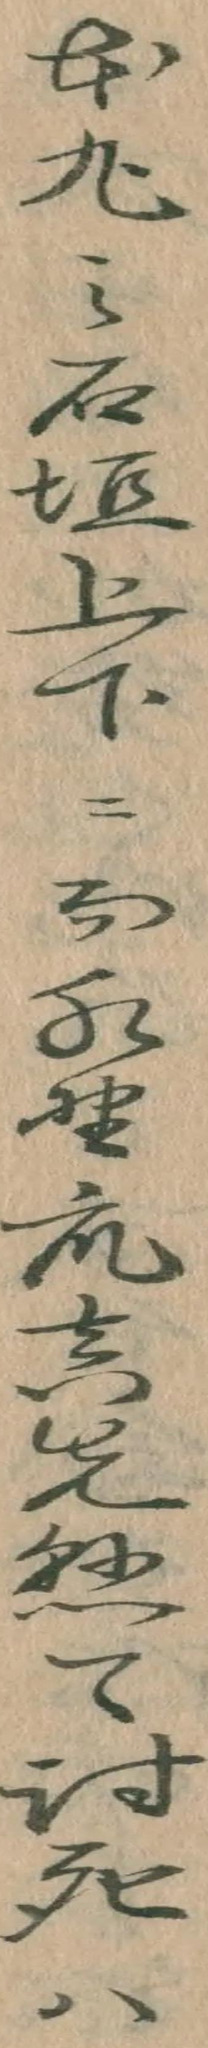本丸之石垣上下に而水野衆真先懸て討死は
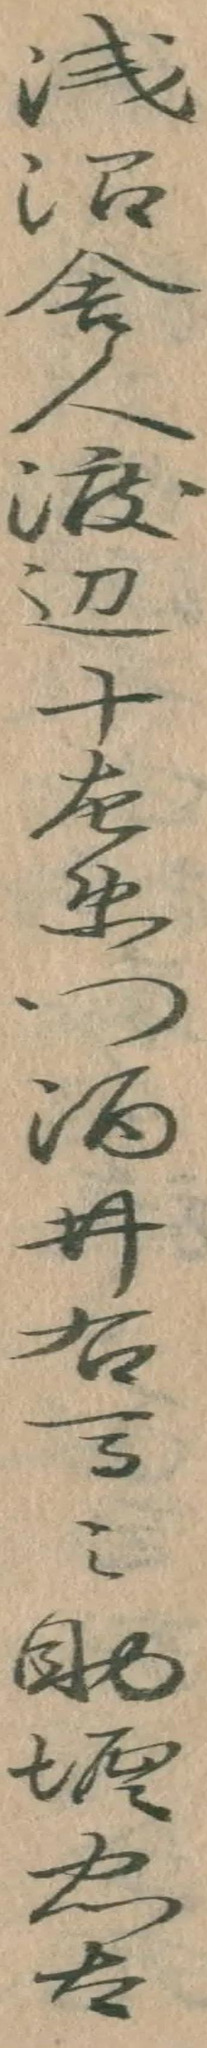浅沼舎人渡辺十左衛門酒井右馬之助堀忠太
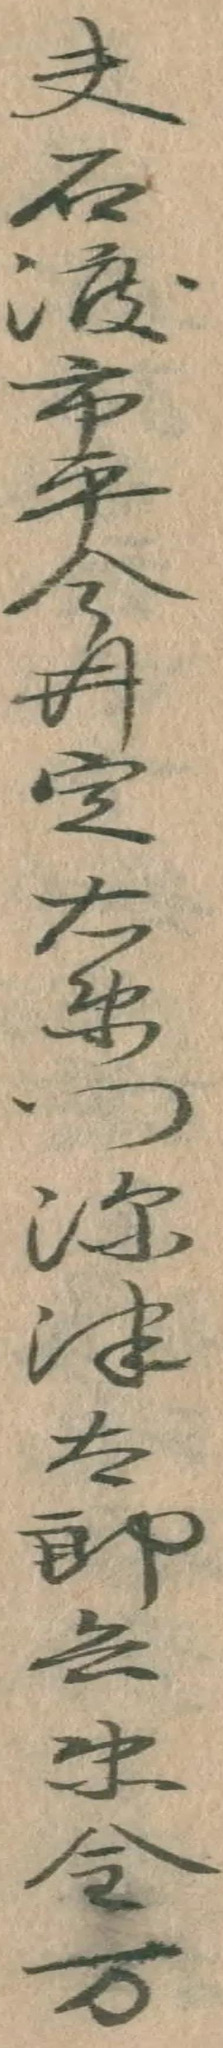夫石渡市平今井定右衛門深津太郎平衛金万
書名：切支丹御退治記 49巻. [7]
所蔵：国立国会図書館 National Diet Library, JAPAN
